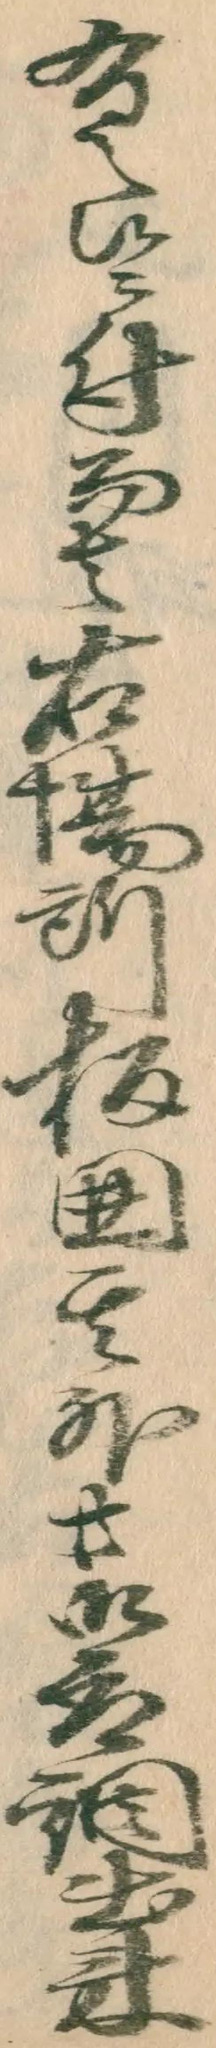有之候ニ付ては右場所板囲其外共御取調出来
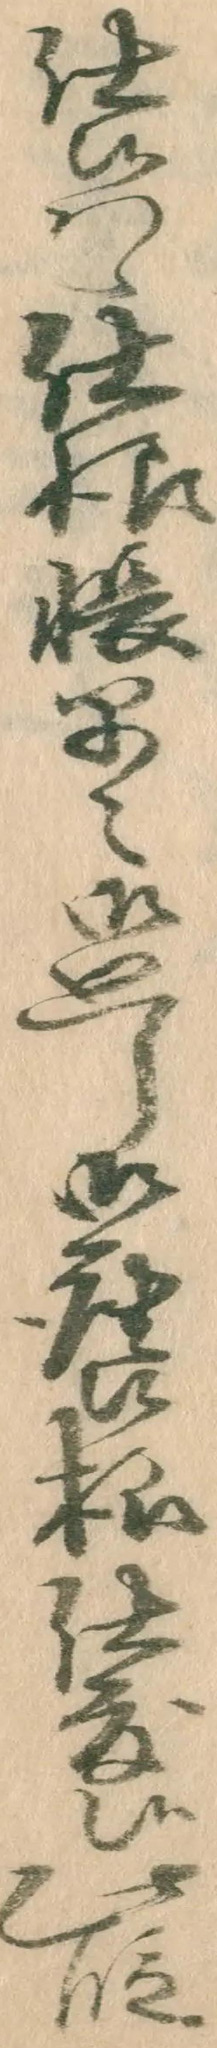仕候ハヽ仕様帳早〻御廻し御座候様仕度候此段

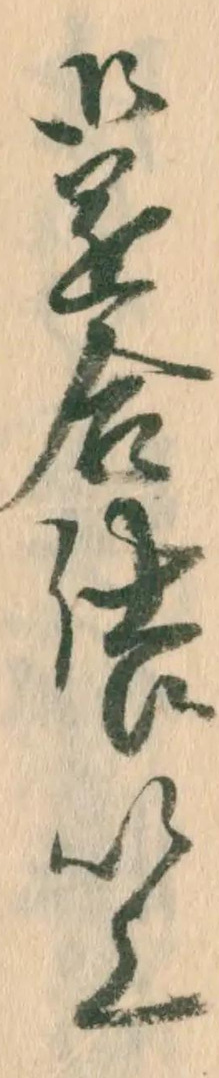御懸合仕候以上
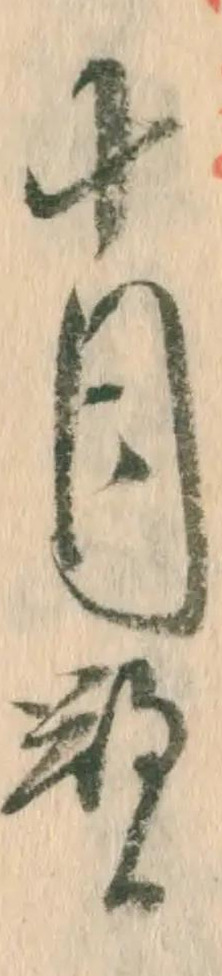十月朔日
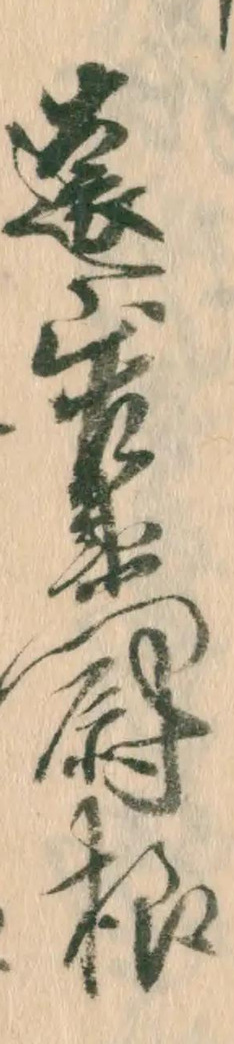│遠山左衛門尉様
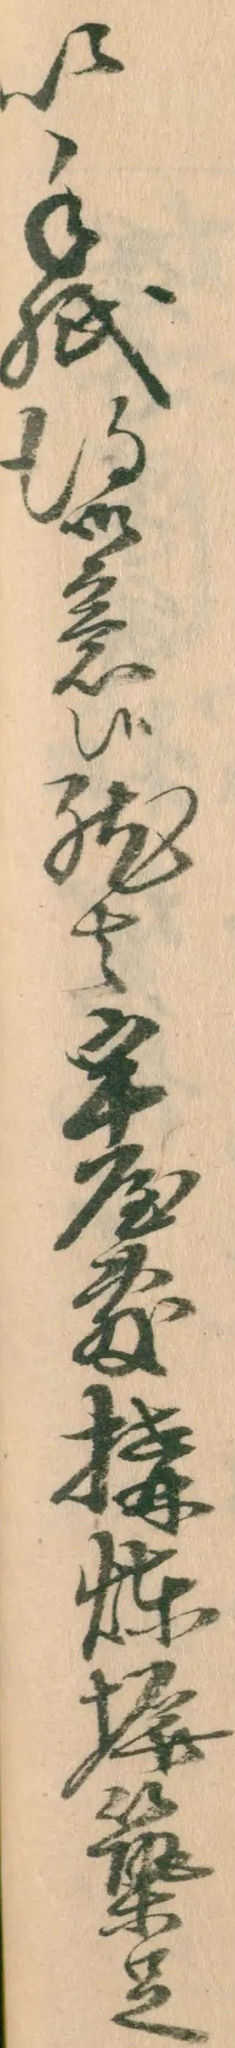以手紙得御意候然は牢屋敷構煉塀築足
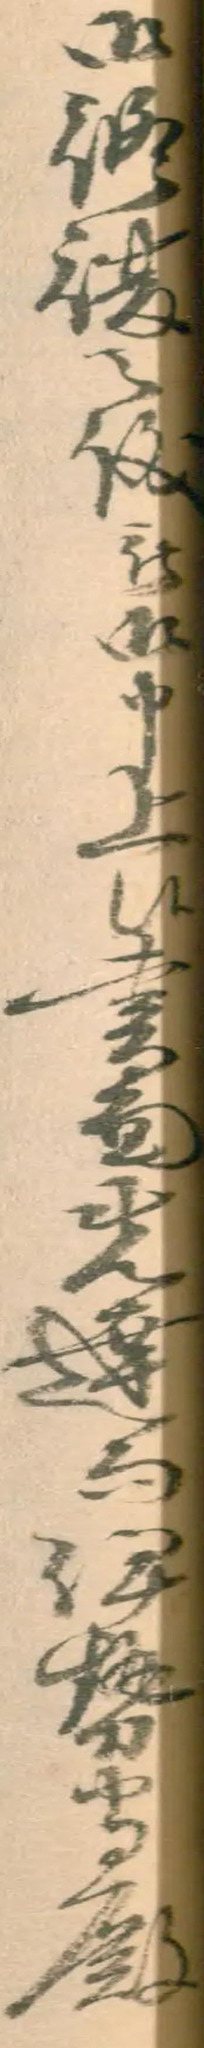御修復之儀被御申上候書面先達て伊勢守殿
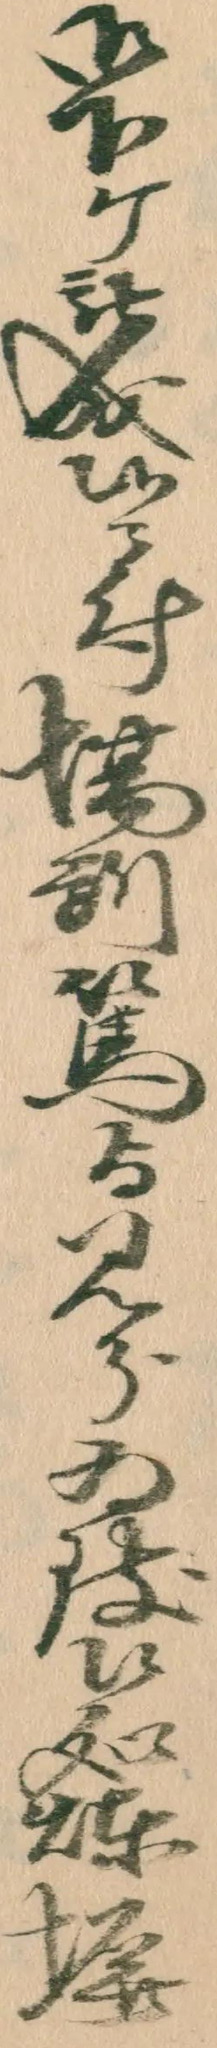御下ケ被成候ニ付場所篤と見分為致候処煉塀
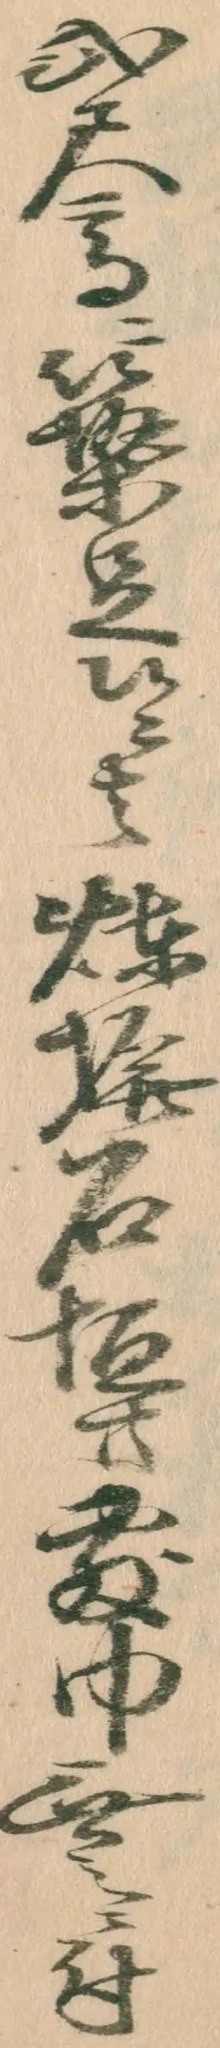弐尺高ニ築足候ニは煉塀石垣共敷巾無之ニ付
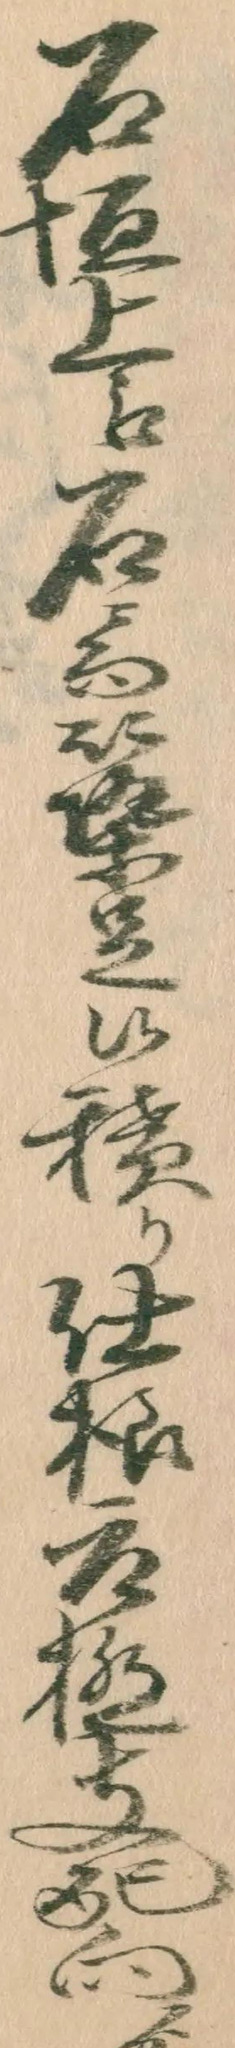石垣上え石ニて築足候積り仕様取極支配向ゟ
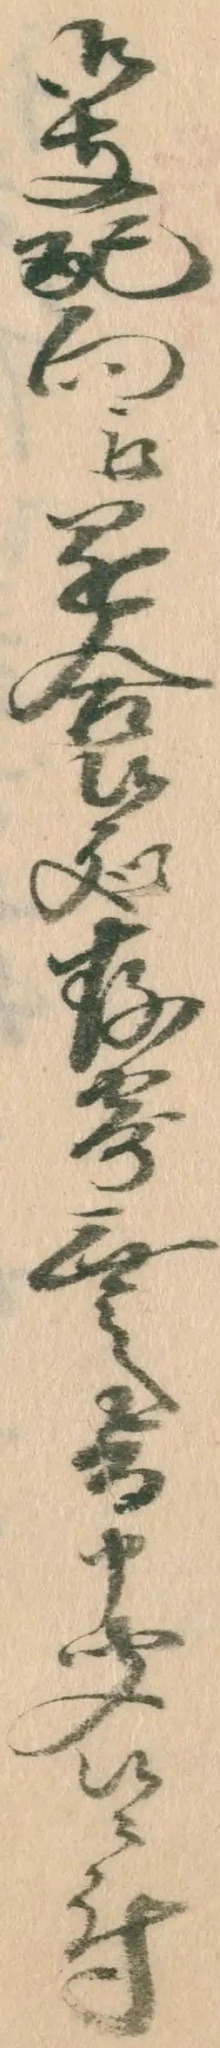御支配向え懸合候処存寄無之旨申聞候ニ付
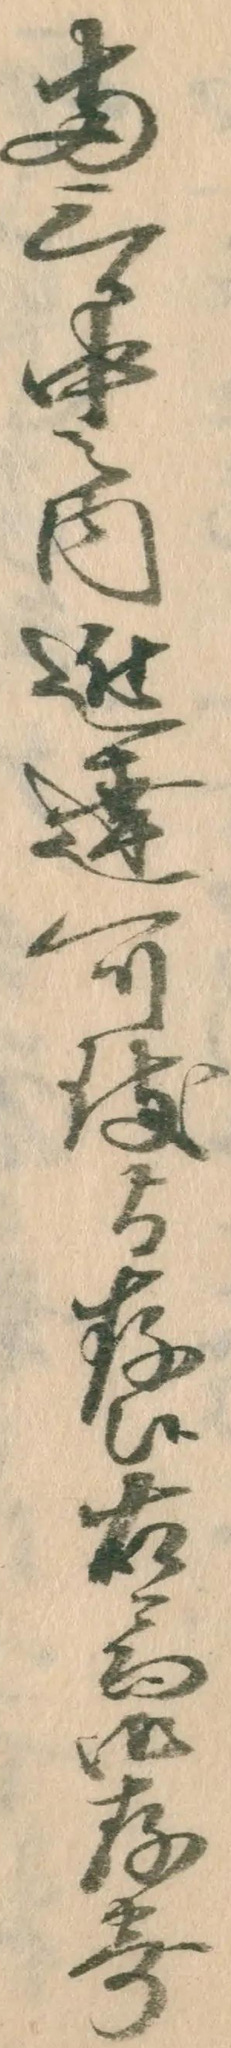両三日中之内進達可致と存候右ニて御存寄

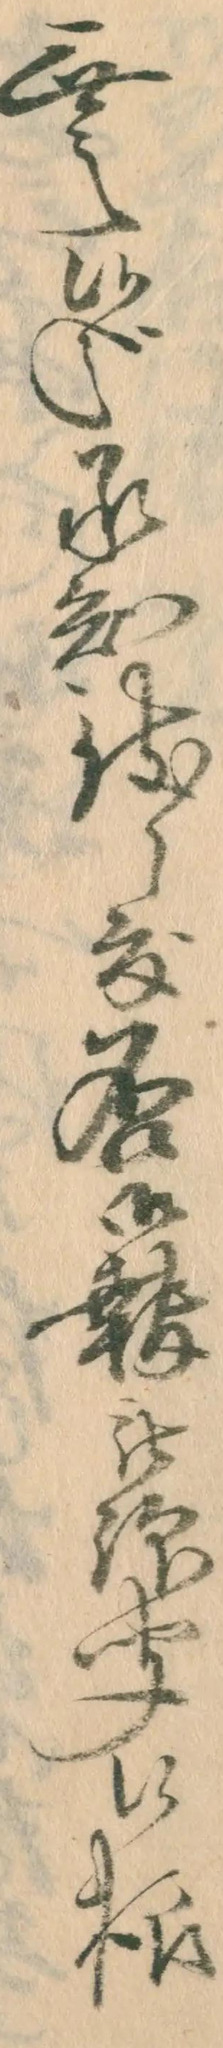無之候哉承知致し度否御報被仰聞候様
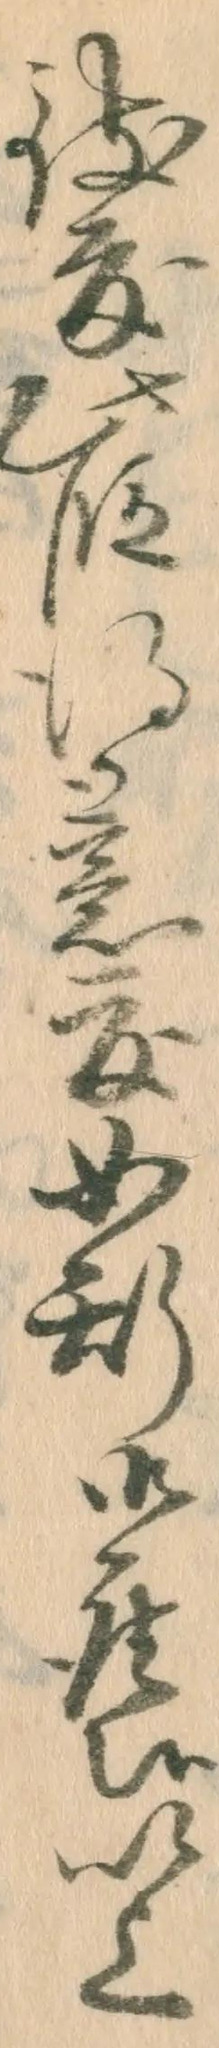致度此段得御意度如斯御座候以上
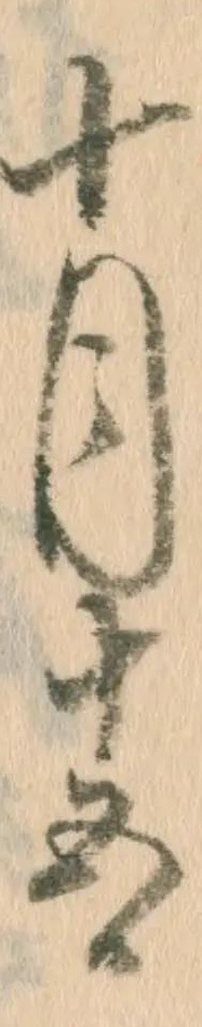十月十五日
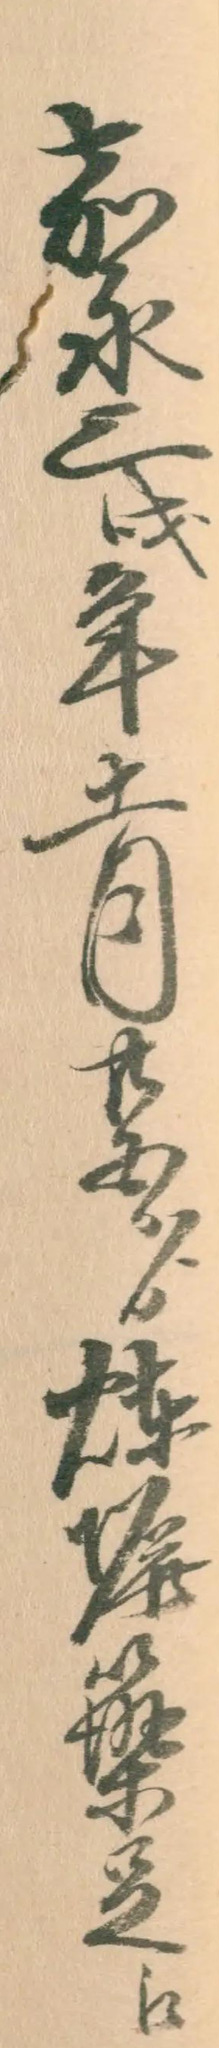一嘉永三戌年十一月廿五日ゟ煉塀築足え
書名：七十冊物類集 71巻. [44] 四十三 牢屋敷御普請御修覆地震ニ付骨折候牢屋掛御褒美之部
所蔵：国立国会図書館 National Diet Library, JAPAN
